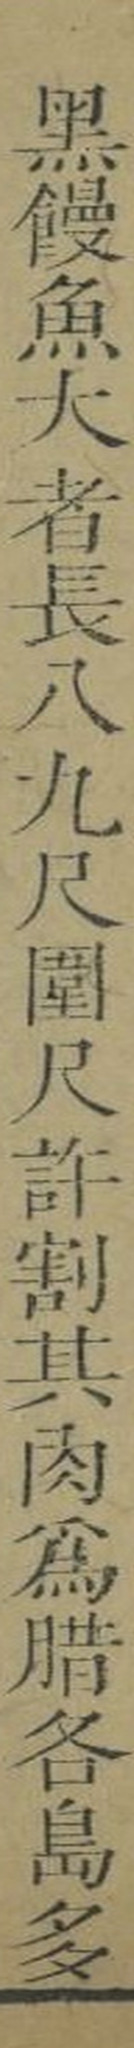黒饅魚大者長八九尺囲尺許割其肉為腊各島多
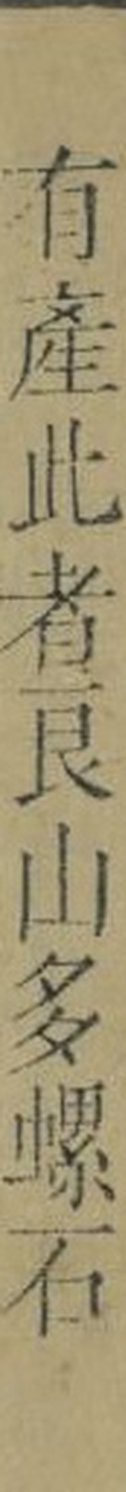有産此者良山多螺石
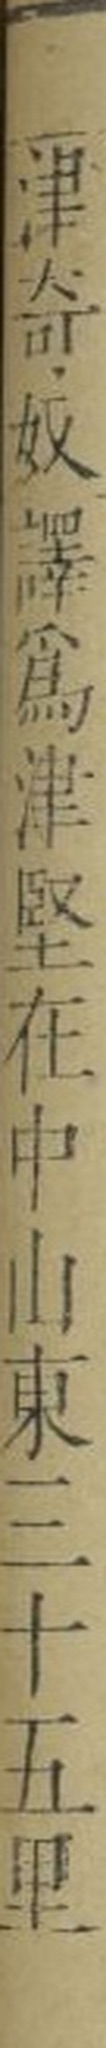[津奇奴]訳為津堅在中山東三十五里
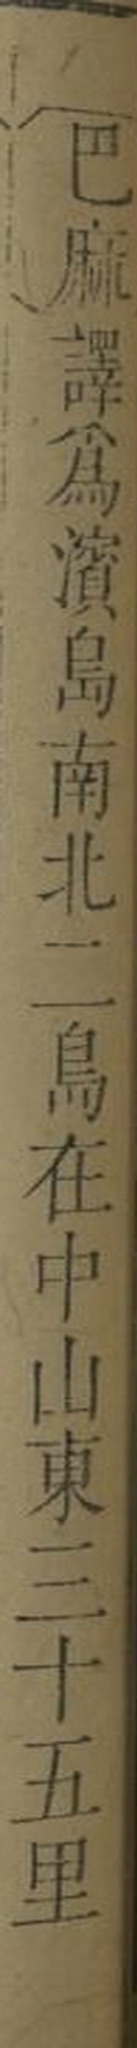[巴麻]訳為浜島南北二島在中山東三十五里
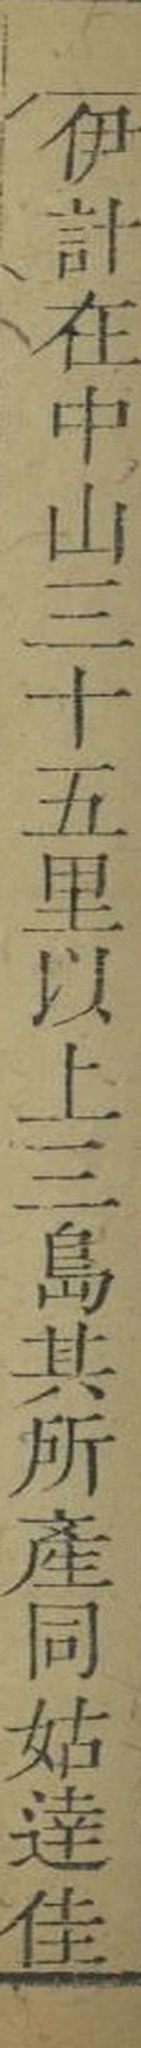[伊計]在中山三十五里以上三島其所産同姑達佳
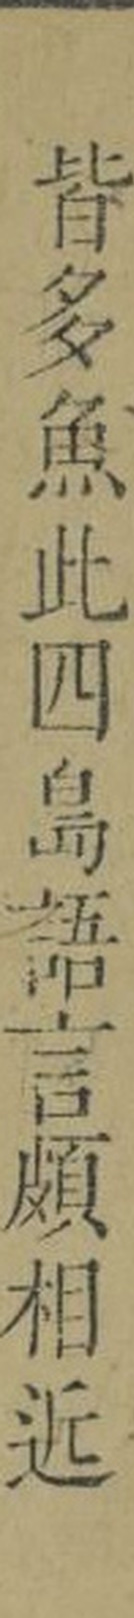皆多魚此四島語言頗相近
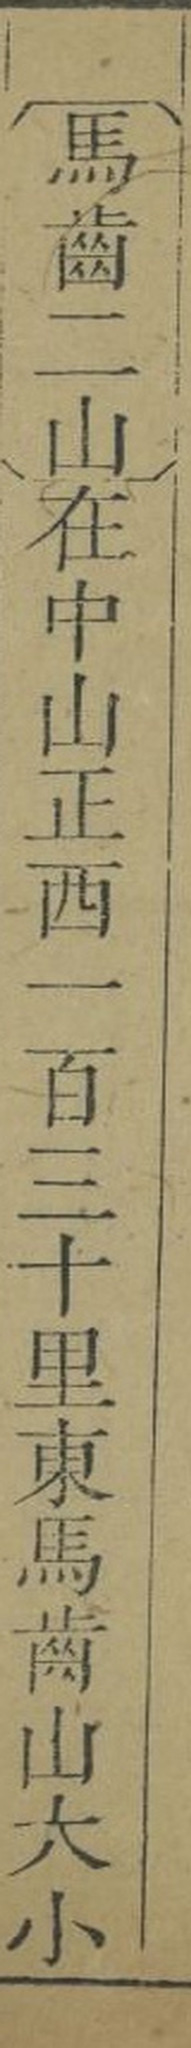[馬歯二山]在中山正西一百三十里東馬歯山大小
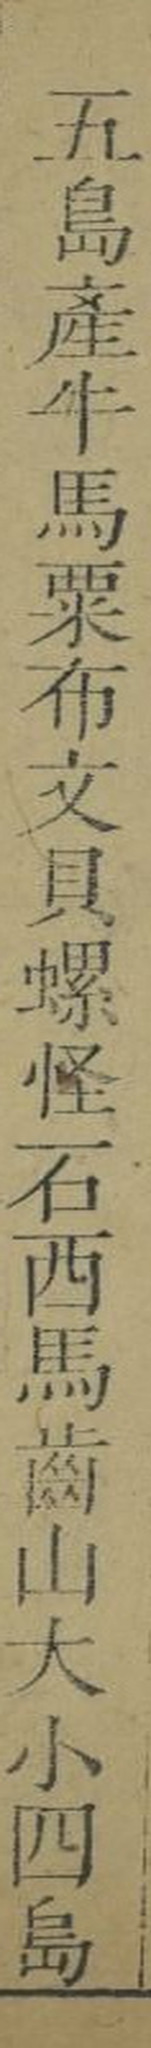五島産牛馬粟布文貝螺怪石西馬歯山大小四島
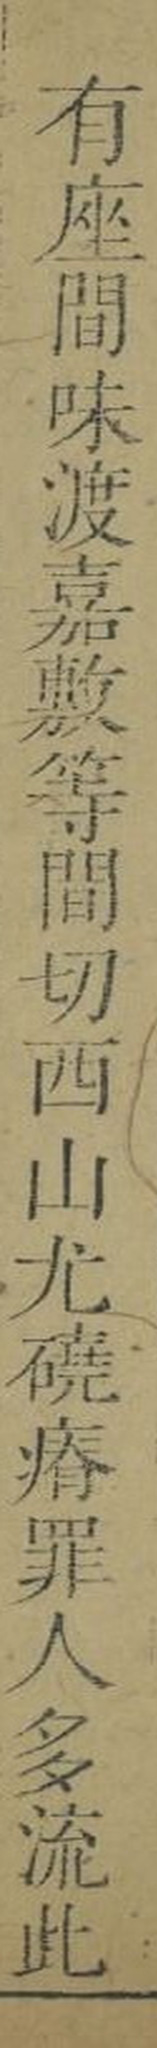有座間味渡嘉敷等間切西山尤磽瘠罪人多流此
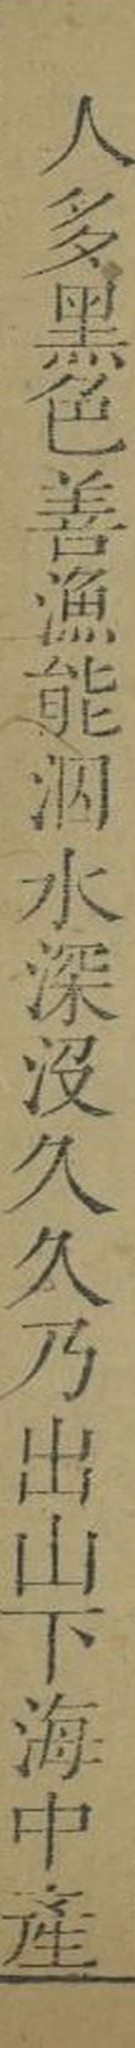人多黒色善漁能泅水深没久久乃出山下海中産
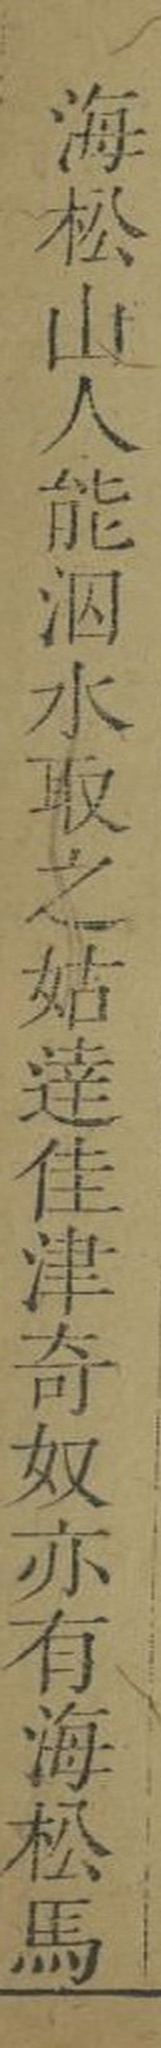海松山人能泅水取之姑達佳津奇奴亦有海松馬

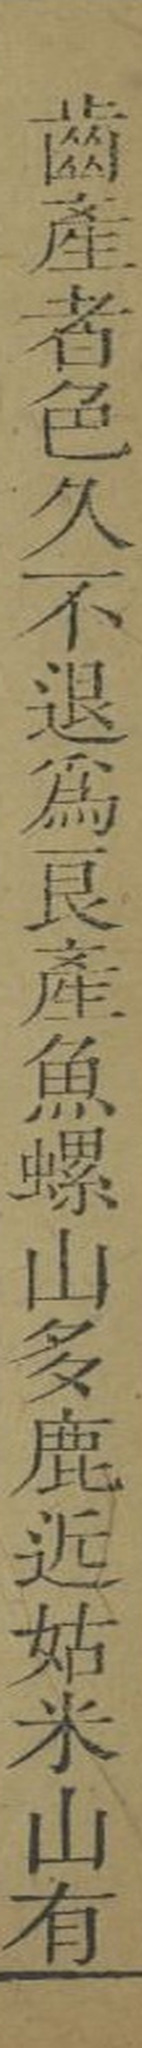歯産者色久不退為良産魚螺山多鹿近姑米山有
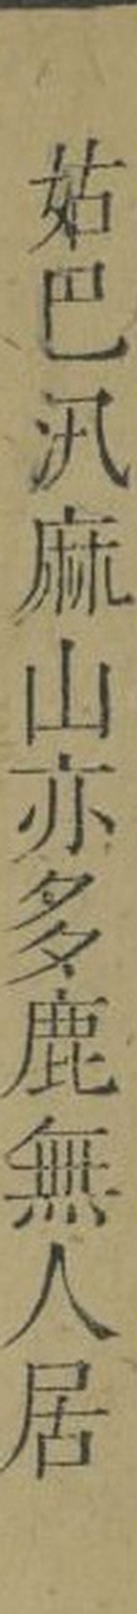姑巴汛麻山亦多鹿無人居
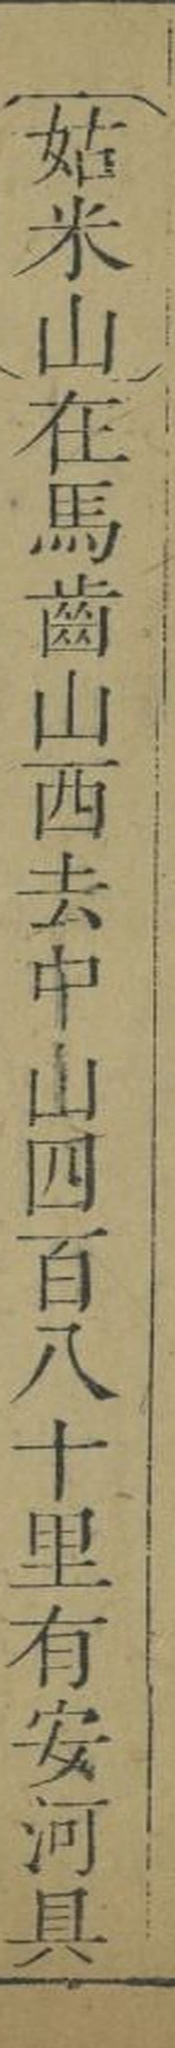[姑米山]在馬歯山西去中山四百八十里有安河具
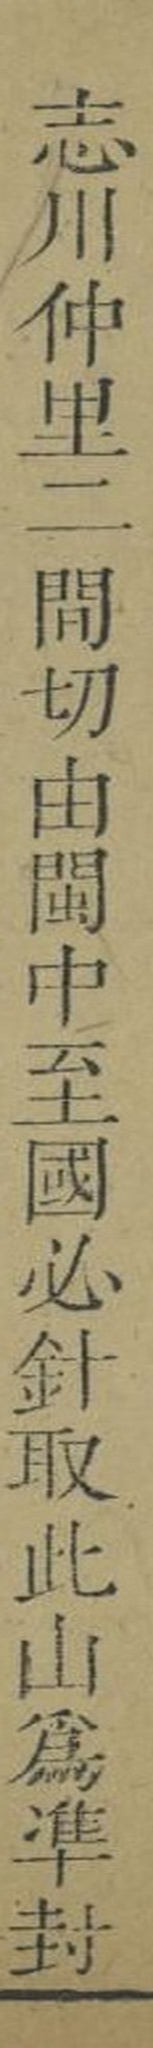志川仲里二間切由閩中至国必針取此山為準封
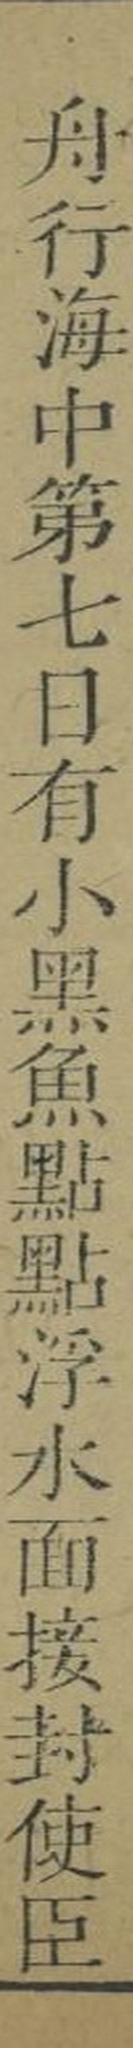舟行海中第七日有小黒魚点点浮水面接封使臣
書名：中山伝信録 巻四
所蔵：University of the Ryukyus Library
